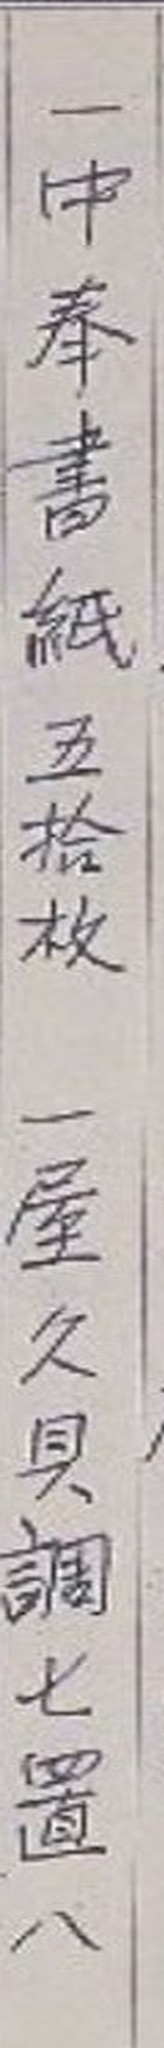一中奉書紙五拾枚一屋久貝調匕置八
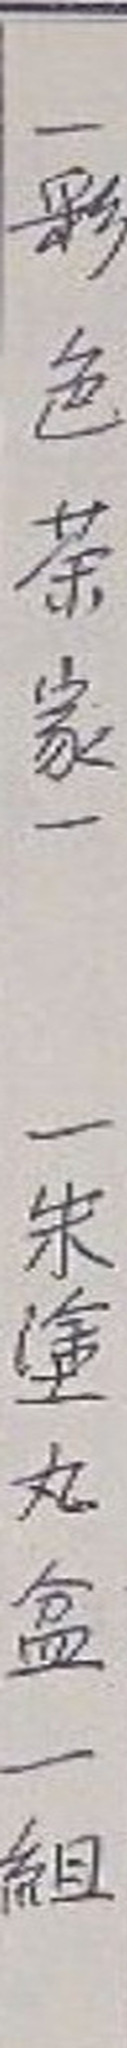一彩色茶家一一朱塗丸盆一組
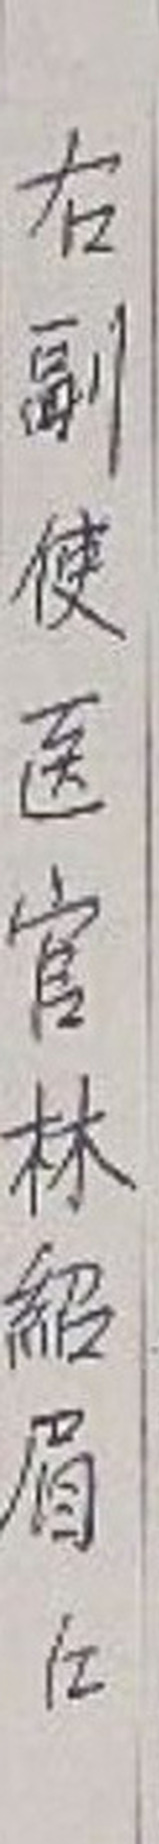右副使医官林紹眉え
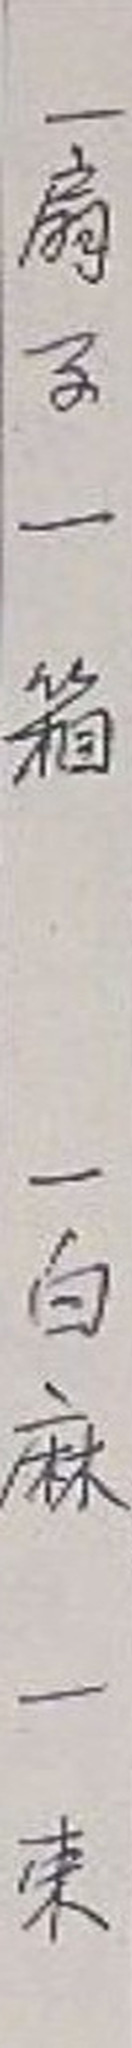一扇子一箱一白麻一束
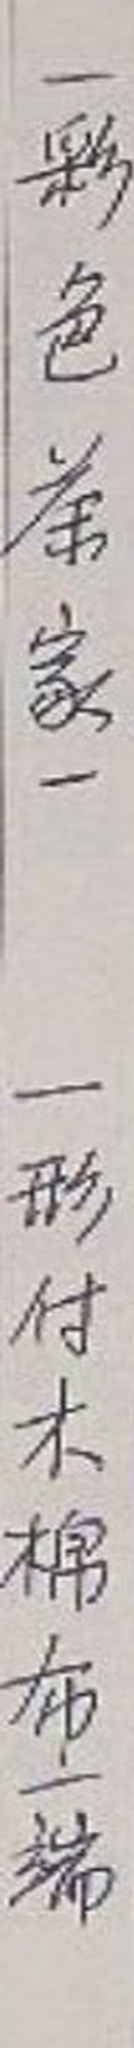一彩色茶家一一形付木棉布一端
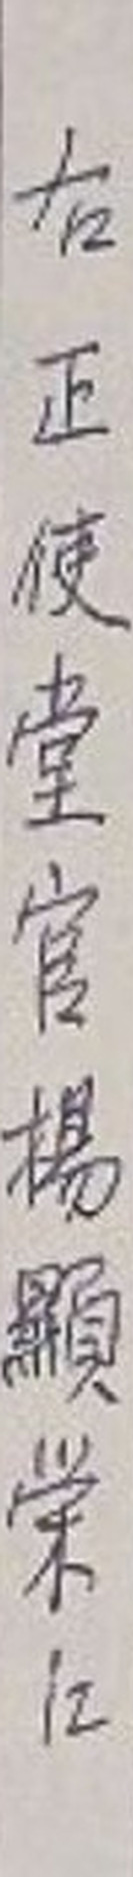右正使堂官楊顕栄え
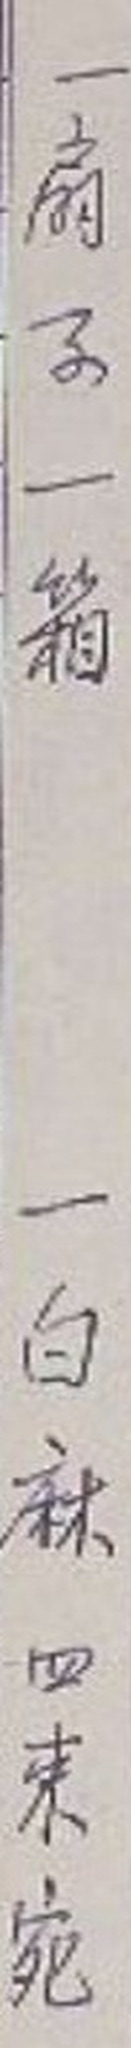一扇子一箱一白麻四束宛
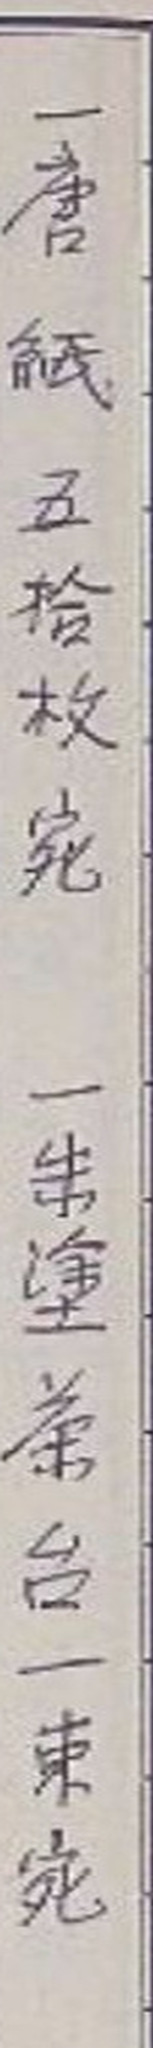一唐紙五拾枚宛一朱塗茶台一束宛
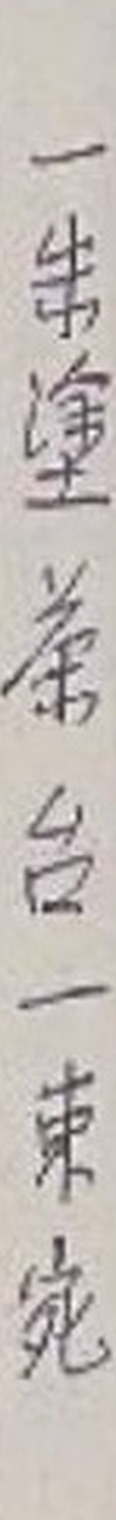一唐紙五拾枚宛一朱塗茶台一束宛
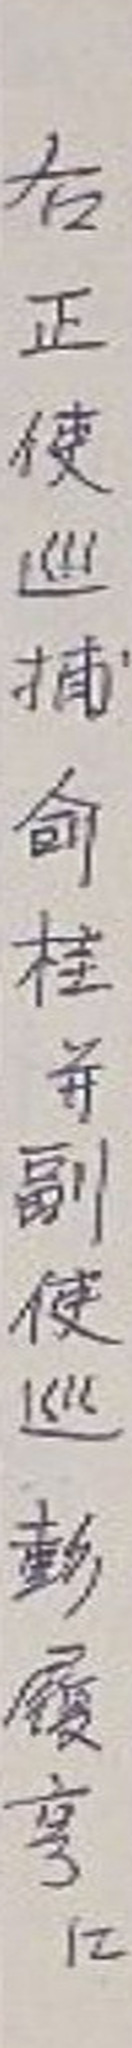右正使巡捕兪桂并副使巡捕彭履亨え
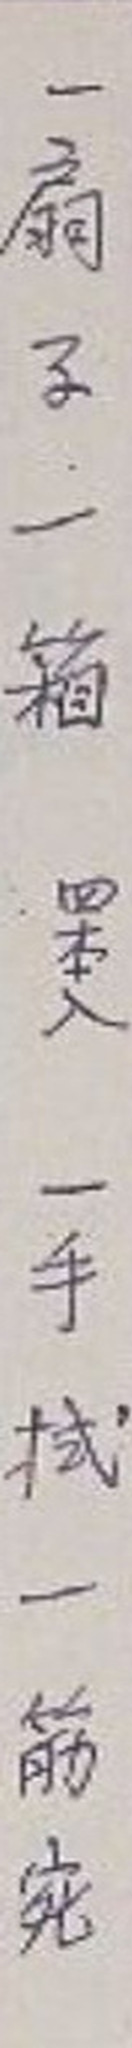一扇子一箱四本入一手拭一筋宛
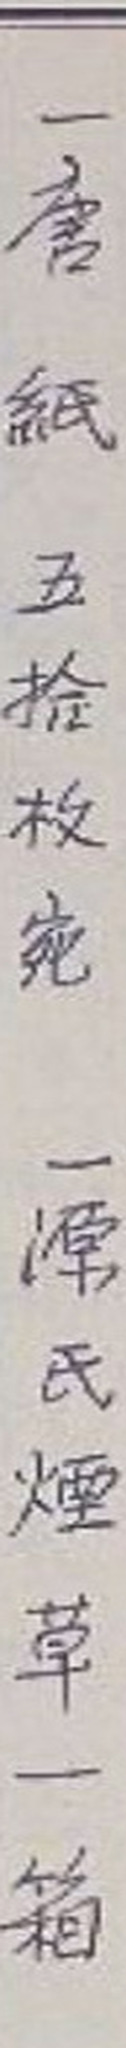一唐紙五拾枚宛一源氏煙草一箱
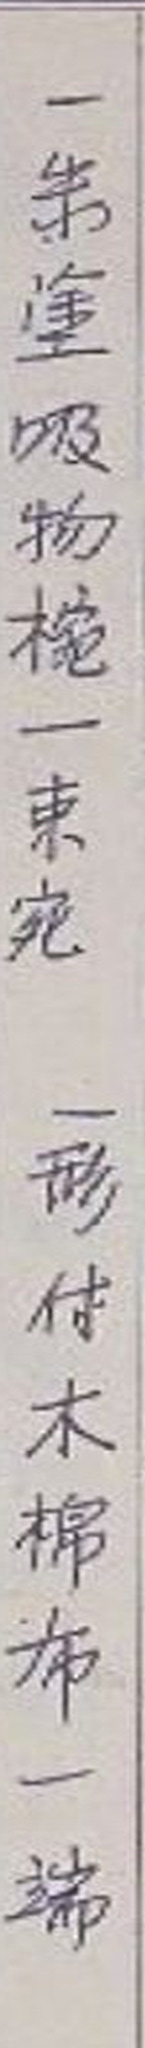一朱塗吸物椀一束宛一形付木棉布一端
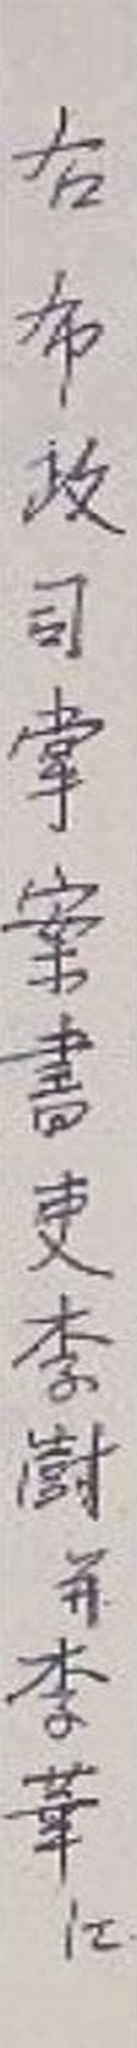右布政司掌案書吏李澍并李華え
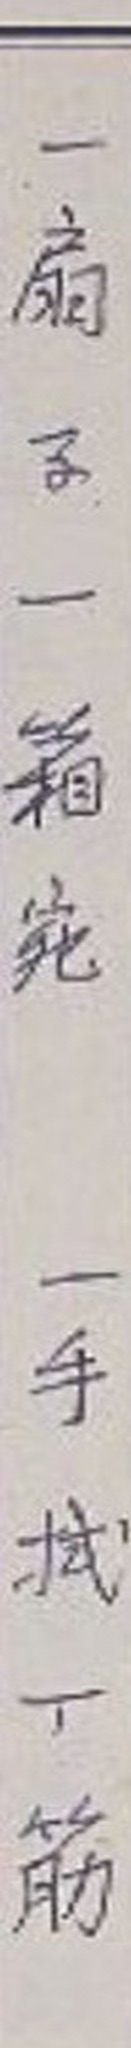一扇子一箱宛一手拭一筋
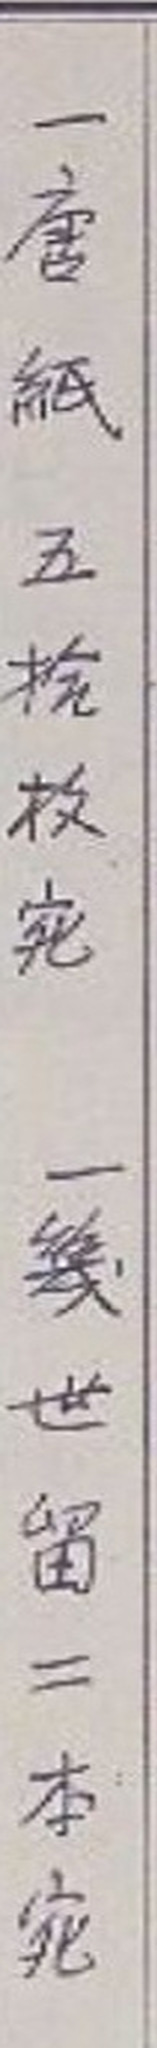一唐紙五拾枚宛一幾世留二本宛
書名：支那冊封使来琉諸記 下巻
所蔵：University of the Ryukyus Library
